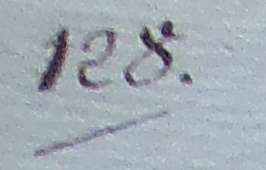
128.
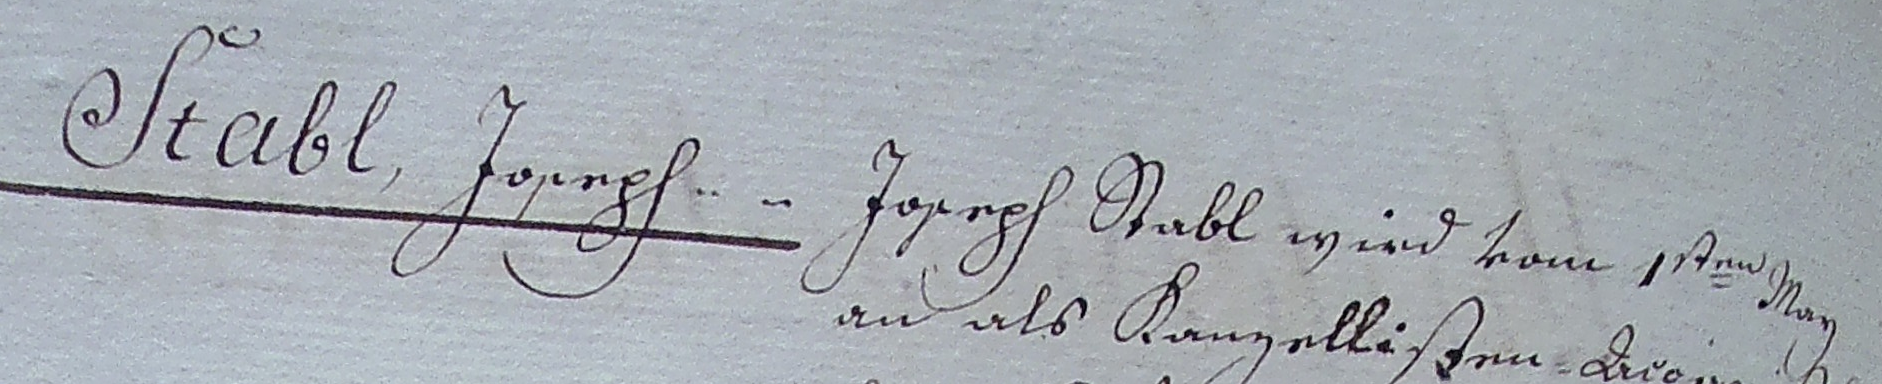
Stabl, Joseph .. .. Joseph Stabl wird vom 1ste͇n May
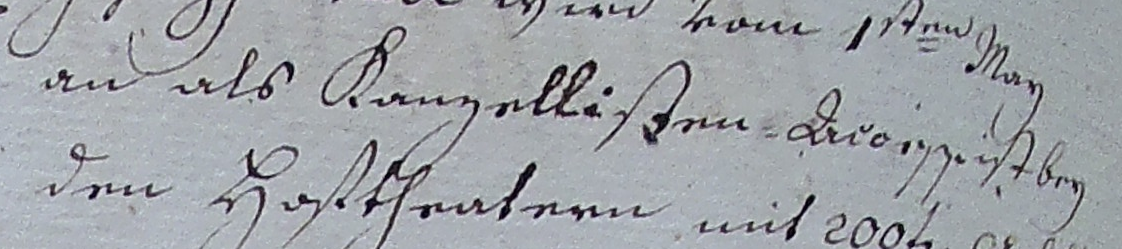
an als Kanzellisten Accessist bey
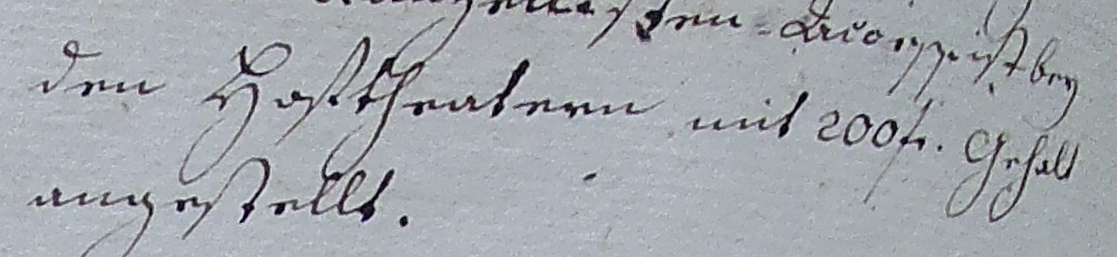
den Hoftheatern mit 200fr. Gehalt
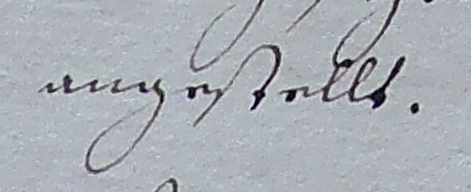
angestellt.
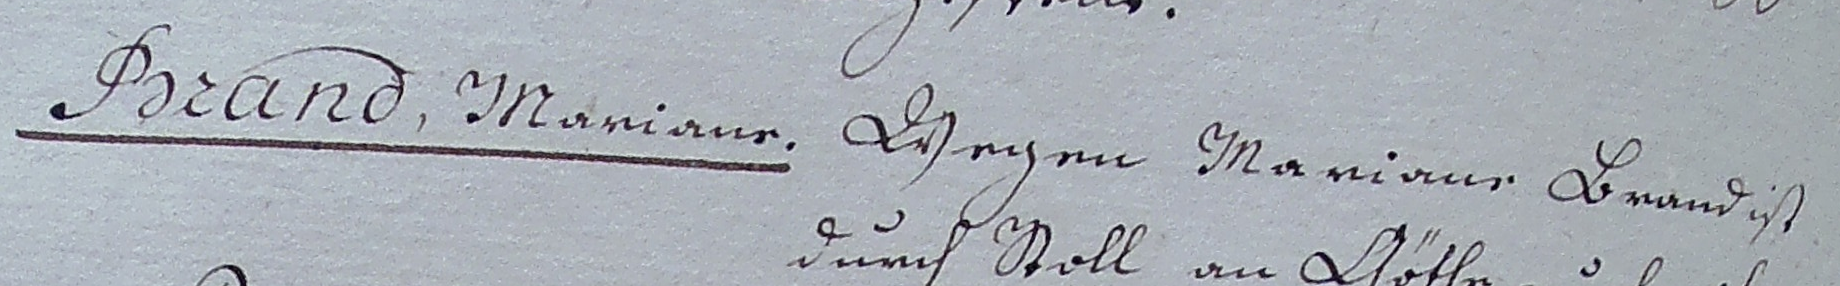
Brand, Mariane. Wegen Mariane Brand ist
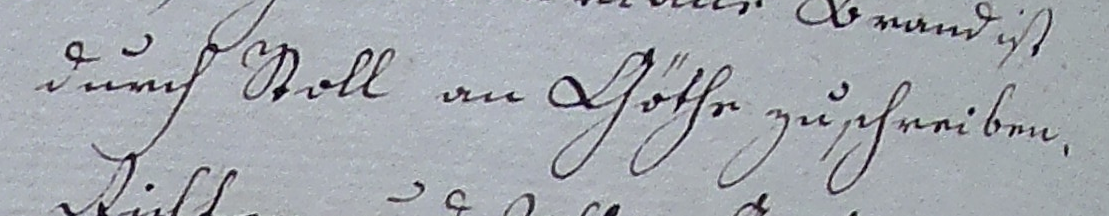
durch Stoll an Göthe zuschreiben.
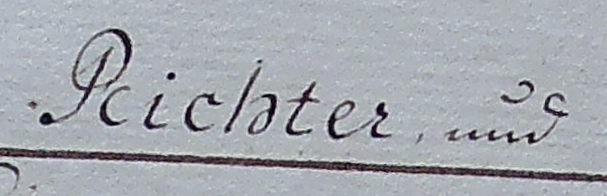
Richter, und
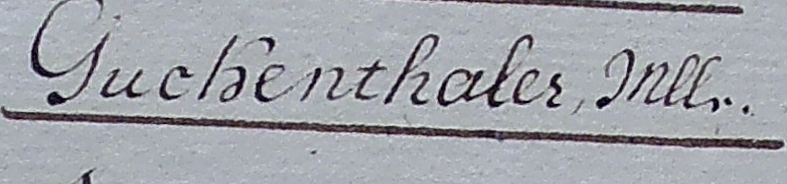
Guckenhaler, Mlle.
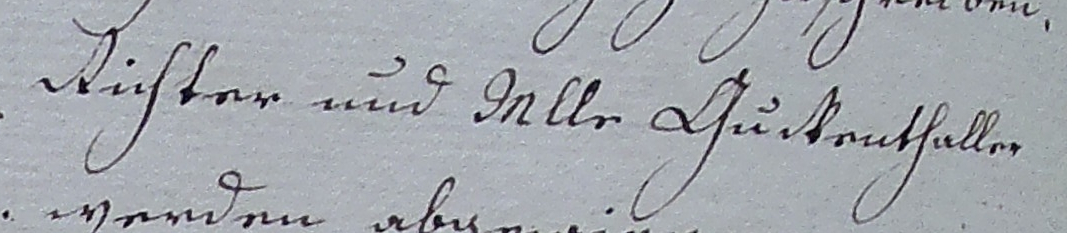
Richter und Mlle Guckenthaller
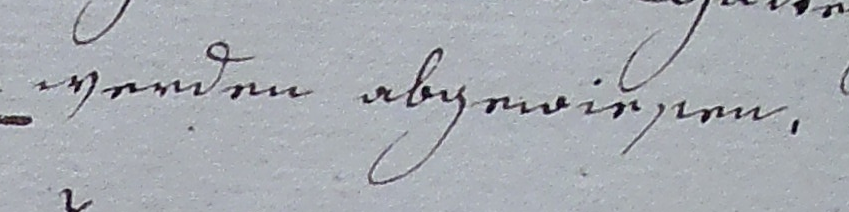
werden abgewiesen.
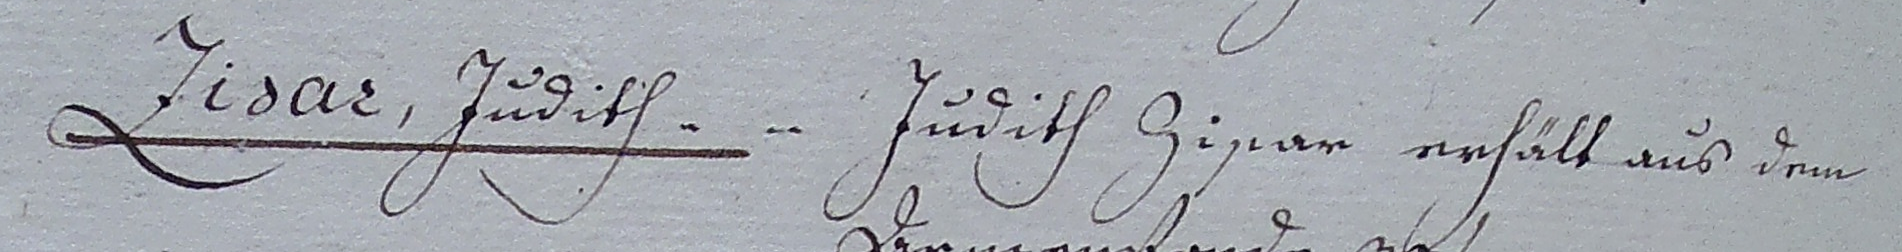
Zisar, Judith .. .. Judith Zisar erhält aus dem
